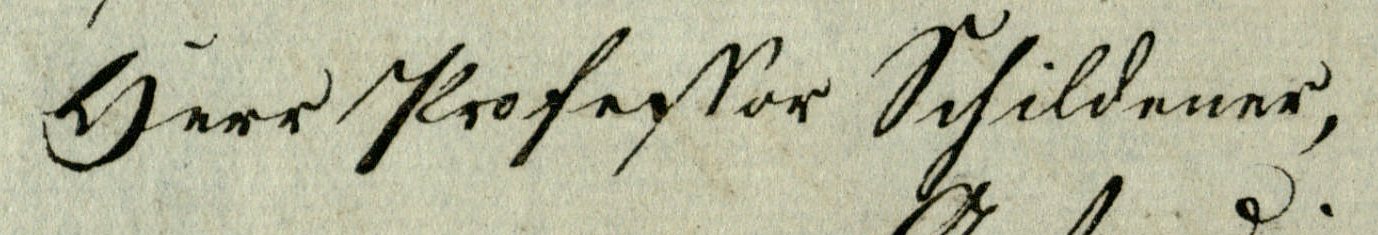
Herr Professor Schildener,
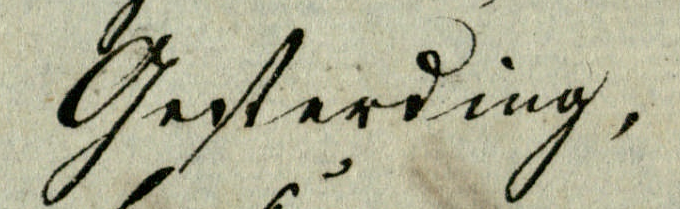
Gesterding,
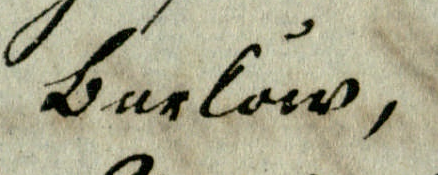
Barkow,
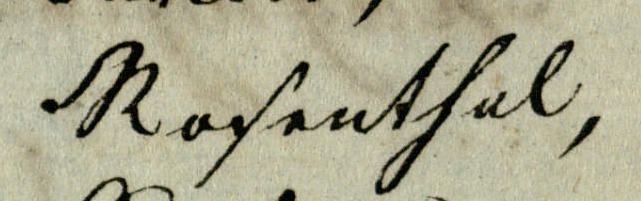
Rosenthal,
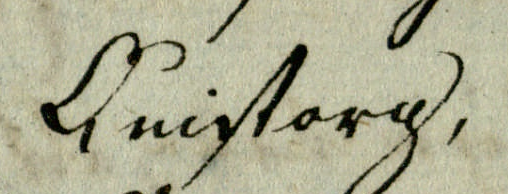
Quistorp,
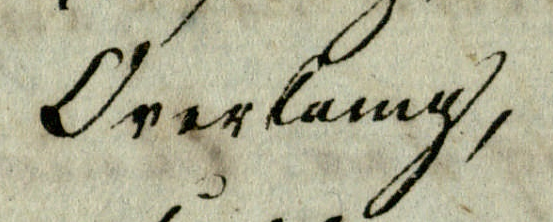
Overkamp,
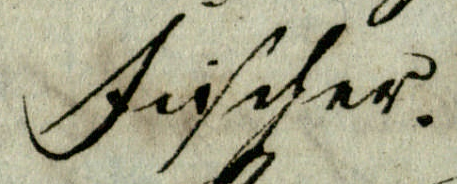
Fischer.
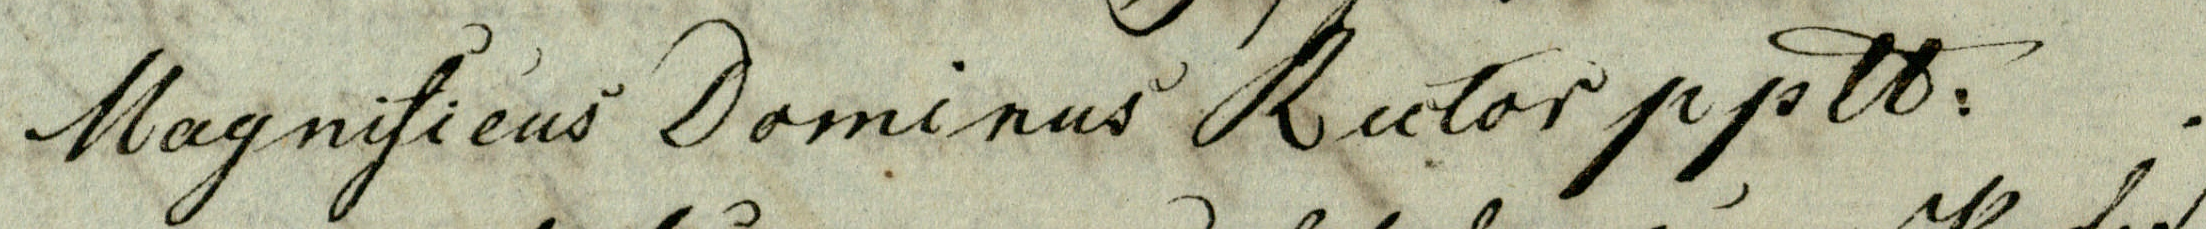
Magnificus Dominus Rector pp tt:
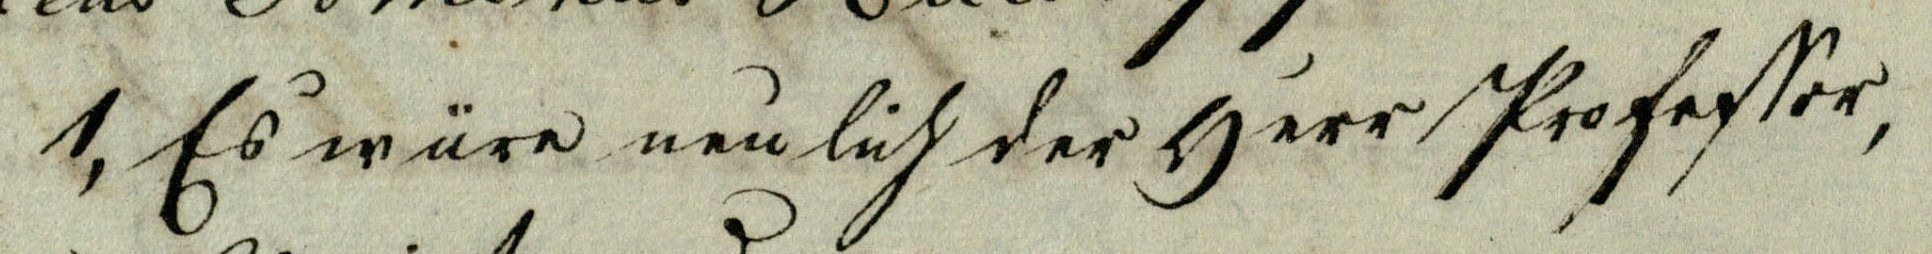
1, Es wäre neulich der Herr Professor,
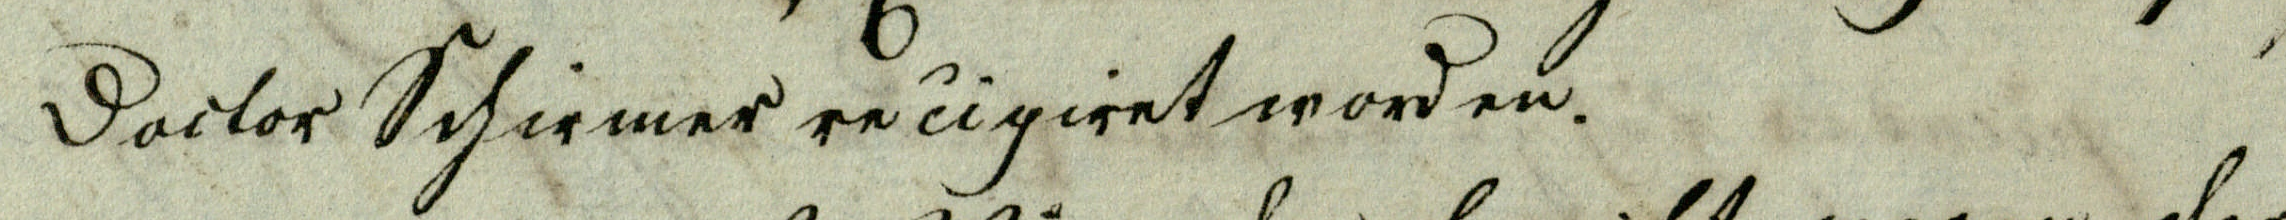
Doctor Schirmer recipiret worden.
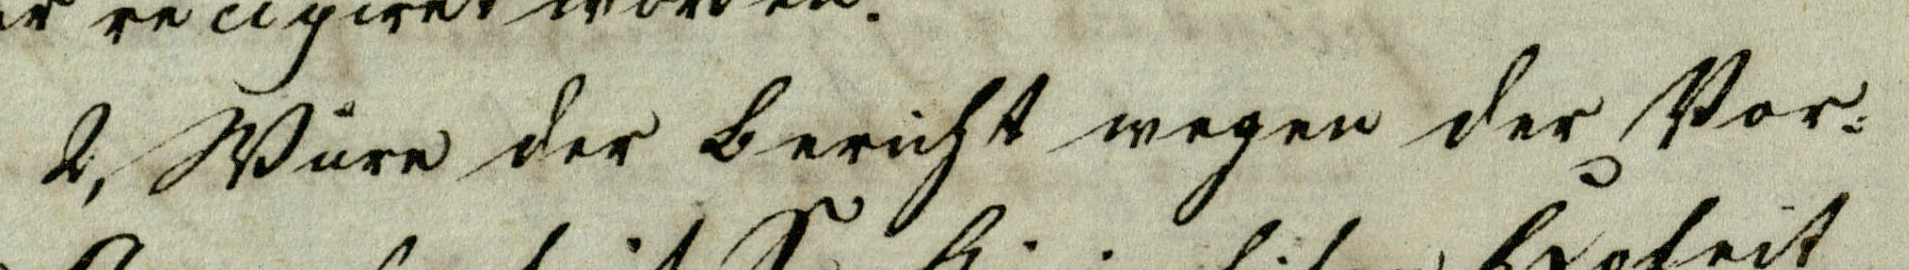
2, Wäre der Bericht wegen der Vor¬
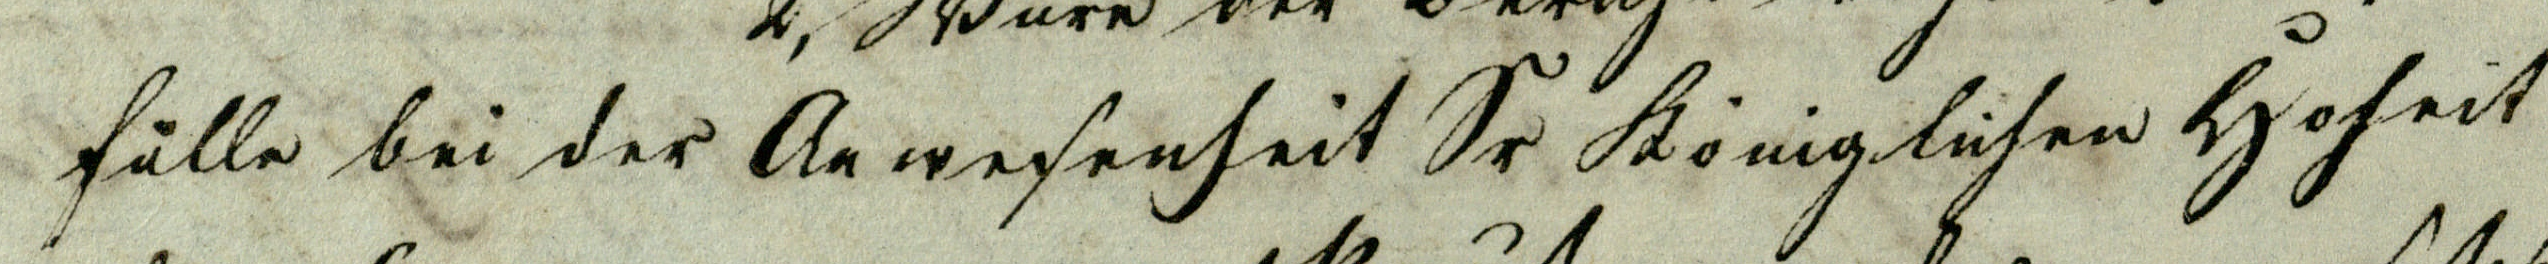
fälle bei der Anwesenheit Sr Königlichen Hoheit
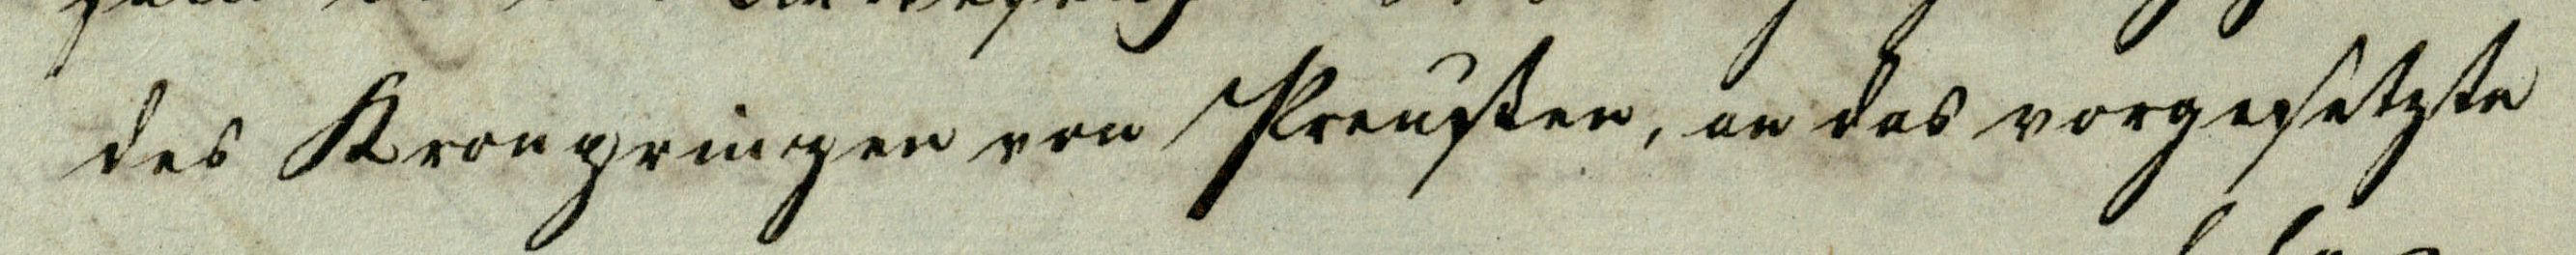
des Kronprinzen von Preußen, an das vorgesetzte
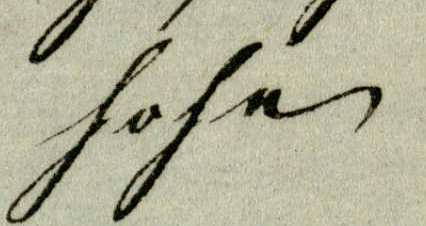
hohe
